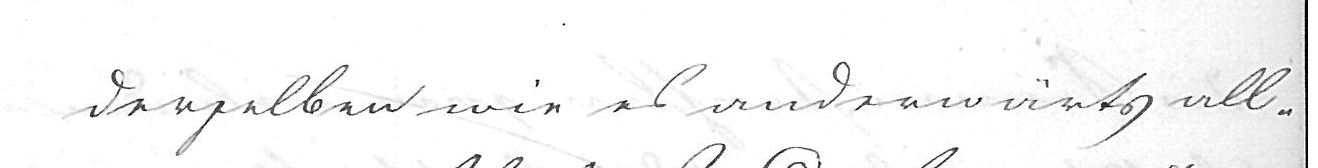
derselben wie es anderwärts all-
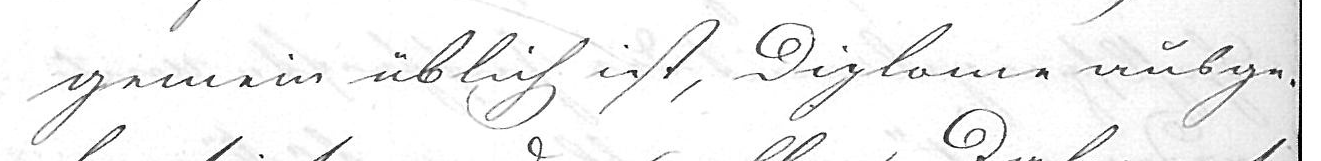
gemein üblich ist, Diplome ausge-
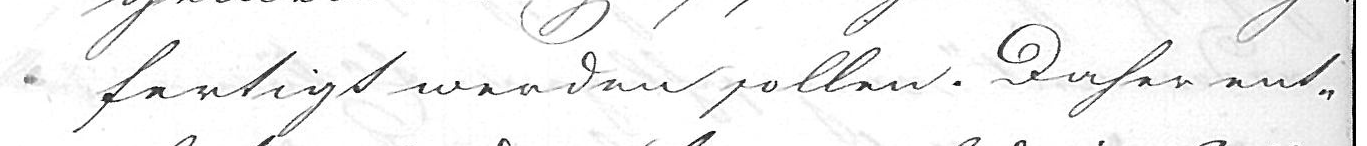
fertigt werden sollen. Daher ent-
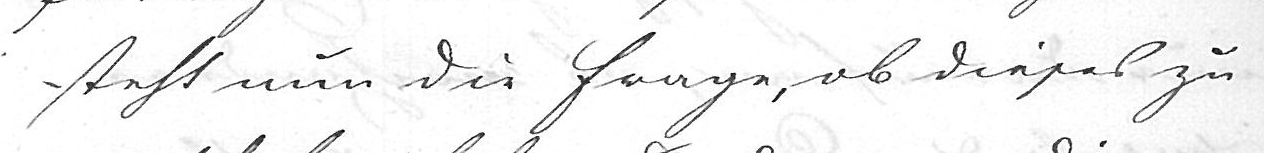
steht nun die Frage, ob dieses zu
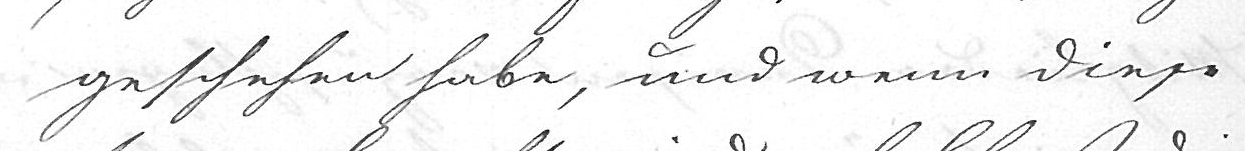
geschehen habe, und wenn diese
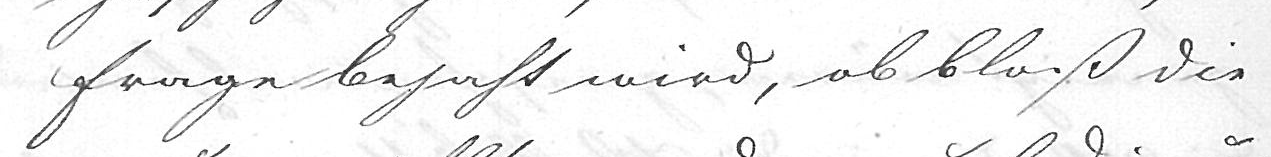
Frage bejaht wird, ob bloß die
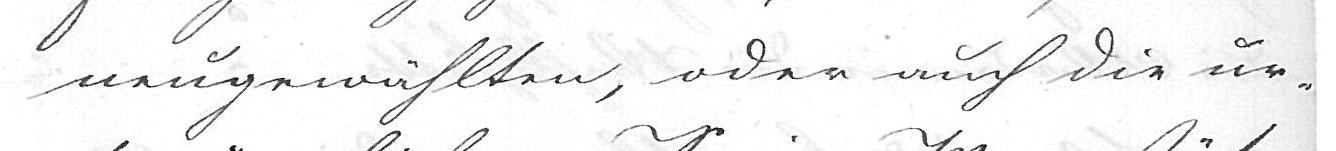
neugewählten, oder auch die ur-
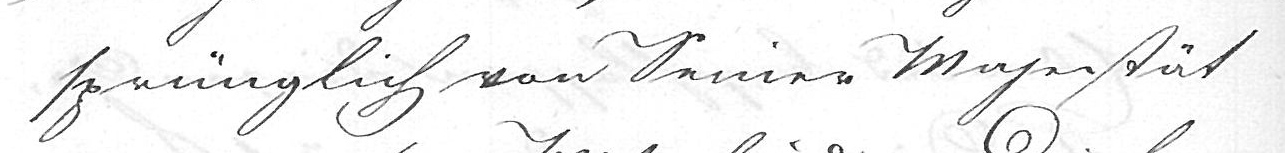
sprünglichen von Seiner Majestät
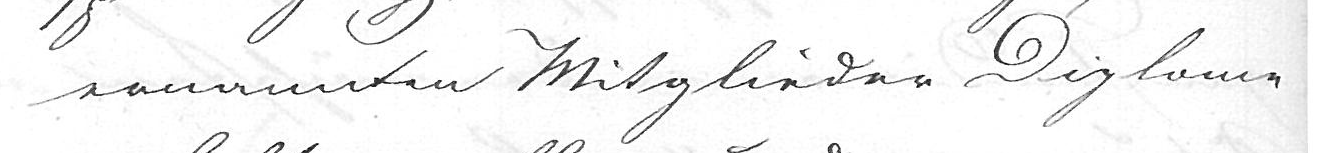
ernannten Mitglieder Diplome
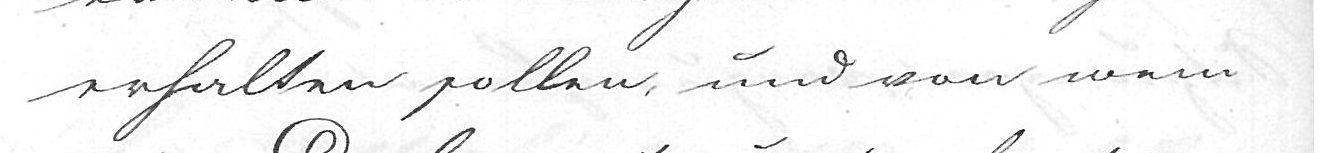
erhalten sollen, und von wem
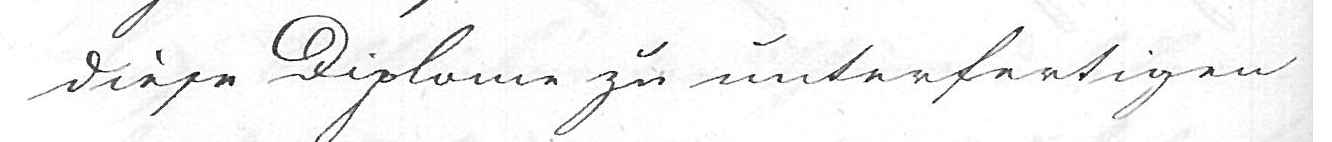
diese Diplome zu unterfertigen
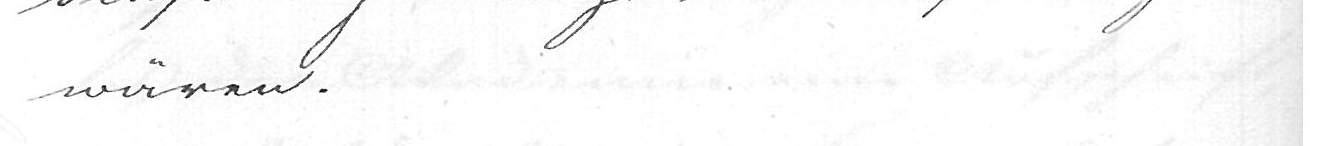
wären.
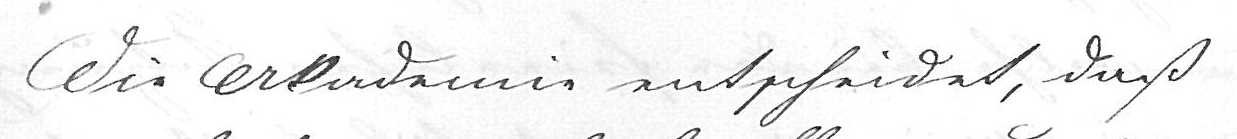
Die Akademie entscheidet, daß
